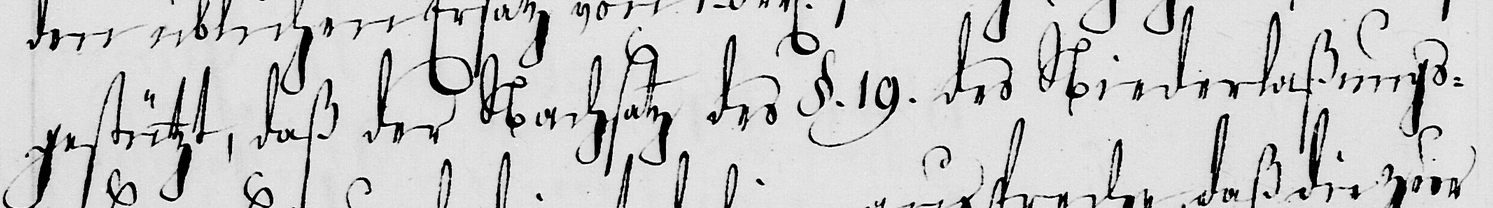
gestützt, daß der Nachsatz des §. 19. des Niederlaßungs¬
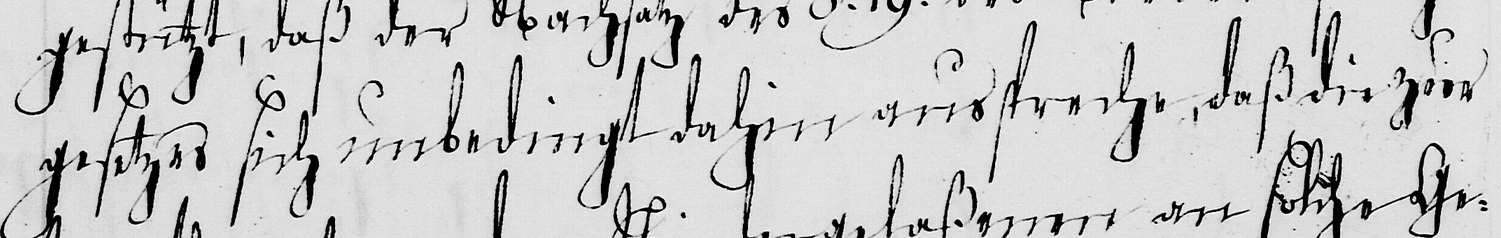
gesetzes sich unbedingt dahin ausspreche, daß die zur
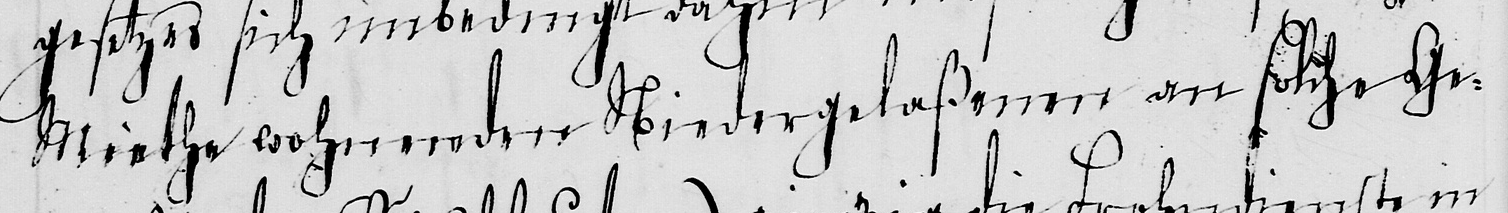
Miethe wohnenden Niedergelaßenen an solche Ge¬
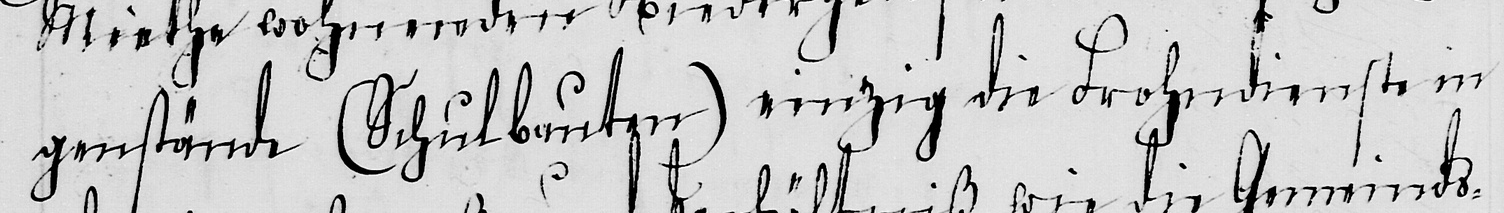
genstände (Schulbauten) einzig die Frohndienste in
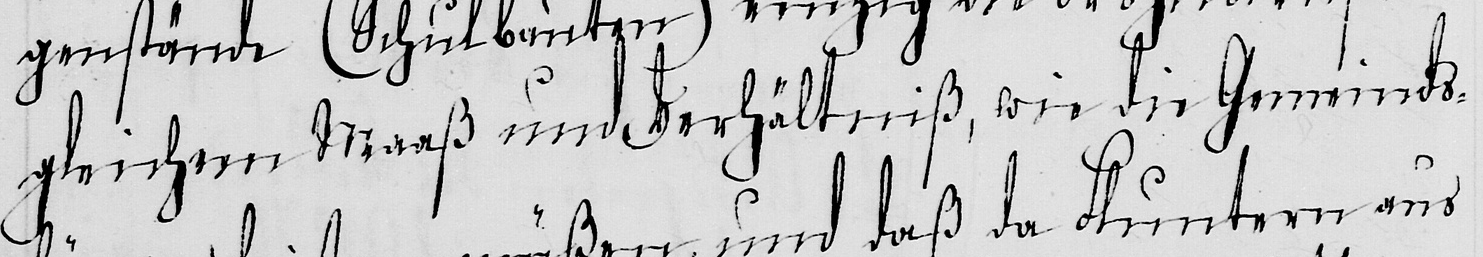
gleichem Maaß und Verhältniß, wie die Gemeinds¬
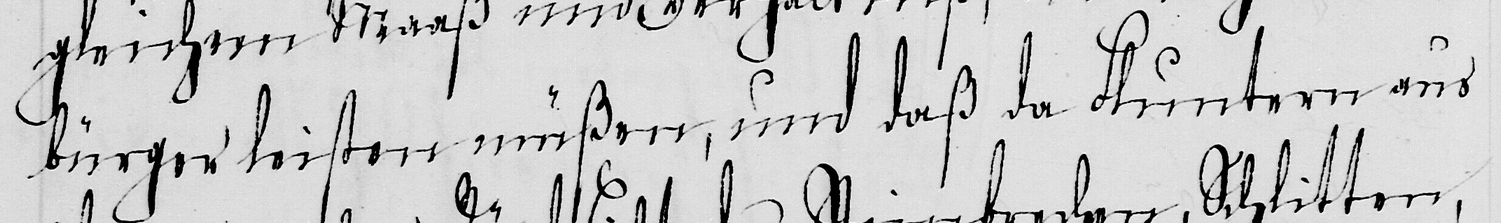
bürger leisten müßen, und daß da Fluntern aus
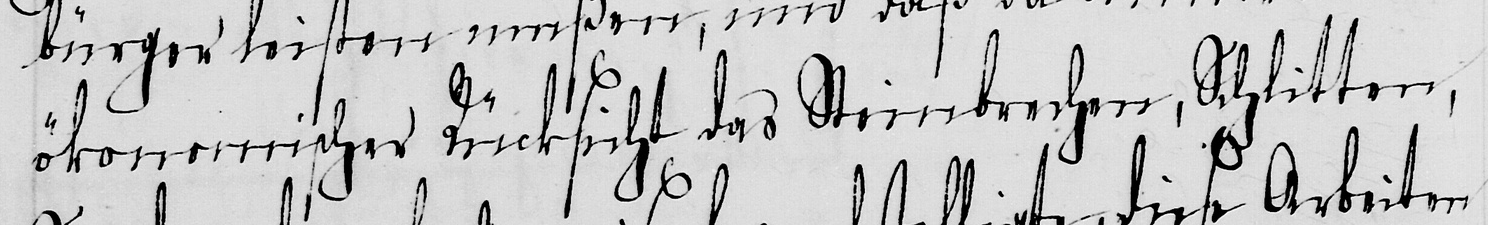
ökonomischer Rücksicht das Steinbrechen, Schlitten,
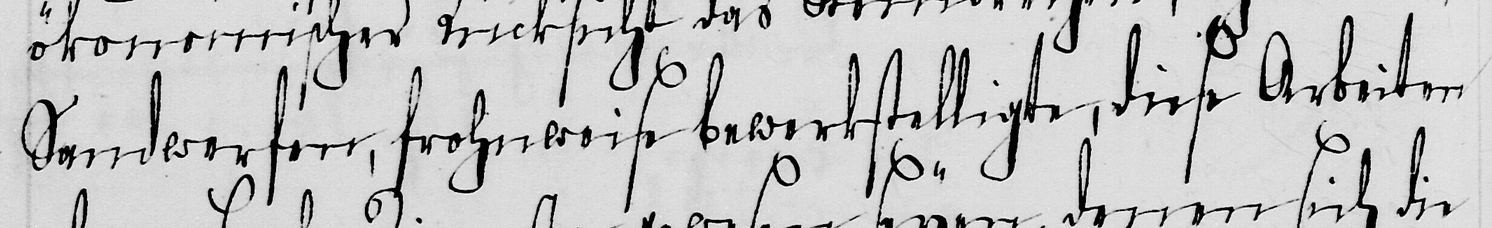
Sandwerfen, frohnweise bewerkstelligte, diese Arbeiten
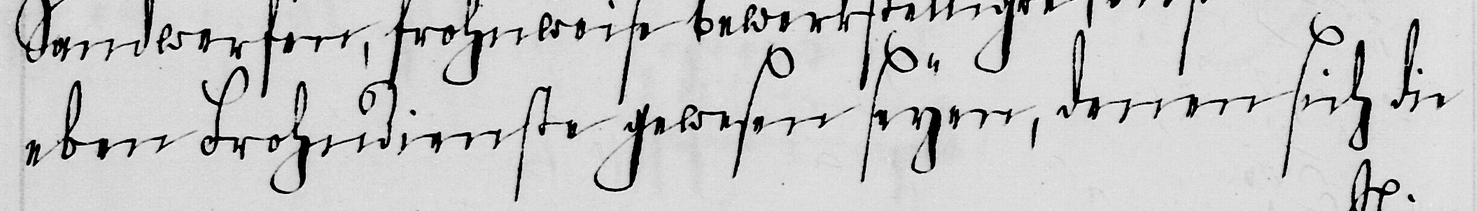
eben Frohndienste gewesen seyen, denen sich die
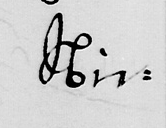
dien¬
